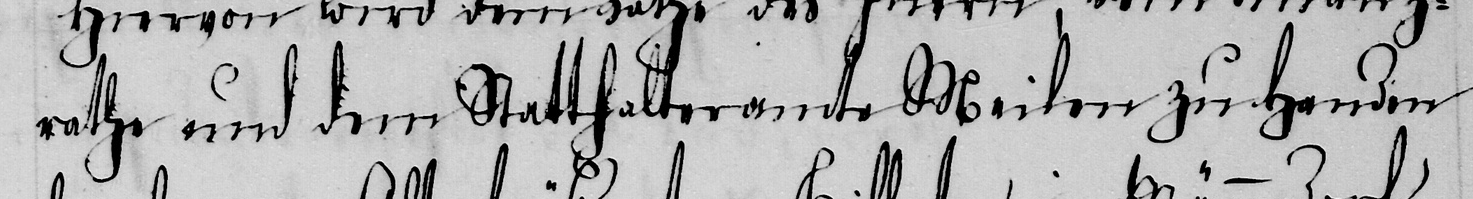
rathe und dem Statthalteramte Meilen zu Handen
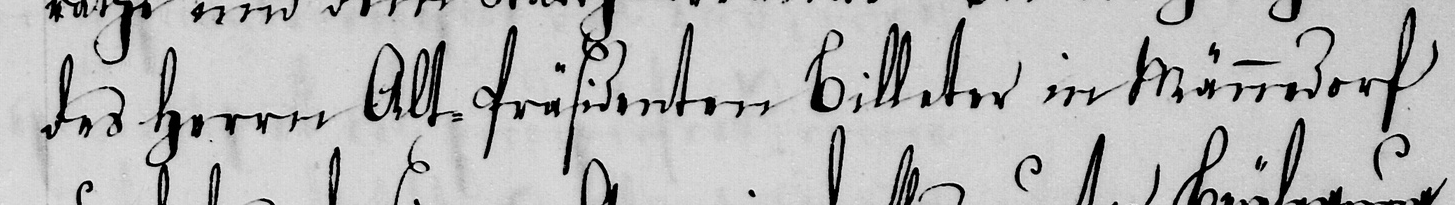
des Herrn Alt-Präsidenten Billeter in Männedorf
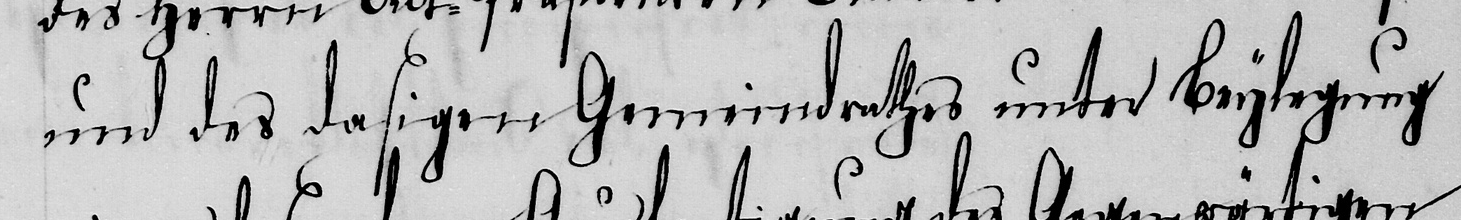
und des dasigen Gemeindrathes unter Beylegung
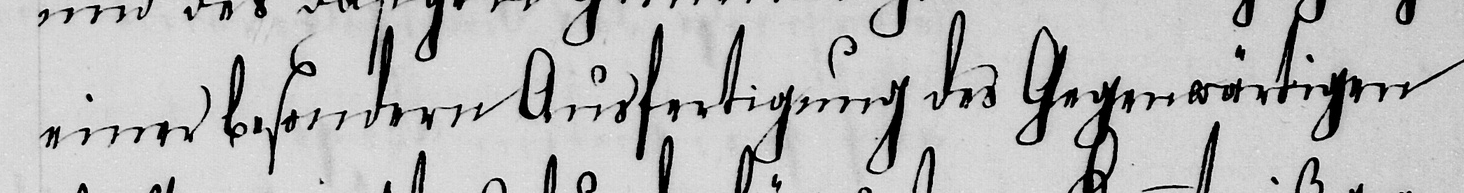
einer besondern Ausfertigung des Gegenwärtigen
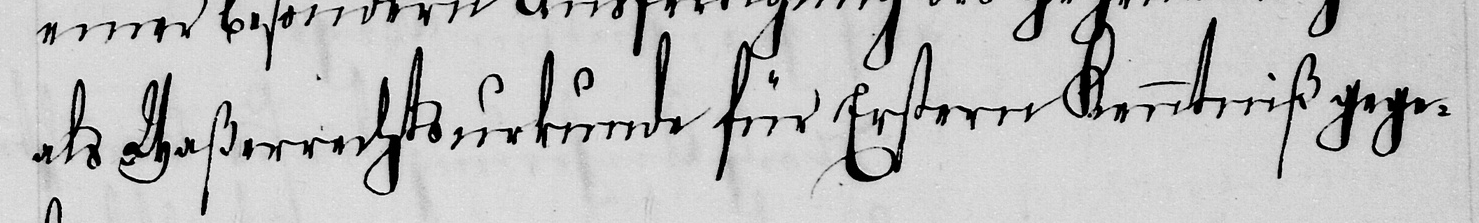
als Waßerrechtsurkunde für Erstern Kenntniß gege¬
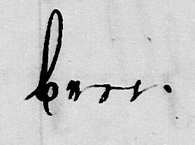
ben.
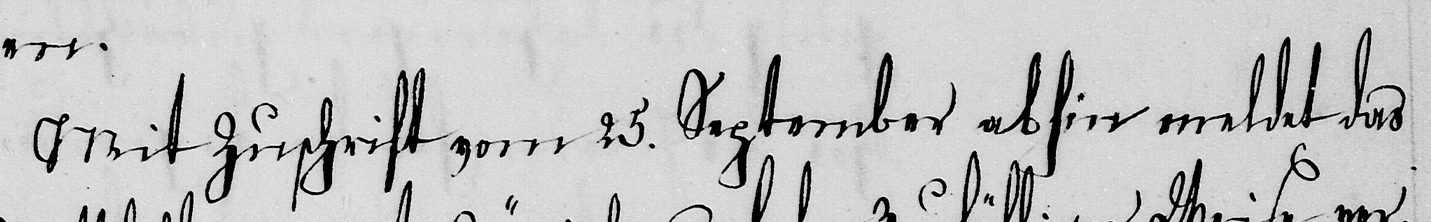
Mit Zuschrift vom 25. September abhin meldet das
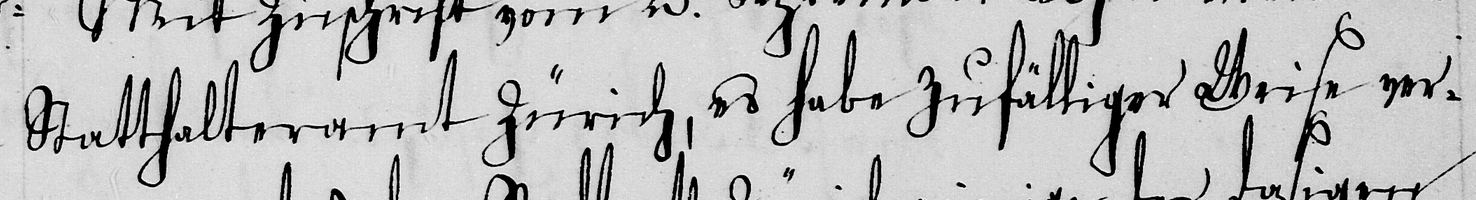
Statthalteramt Zürich, es habe zufälliger Weise ver¬
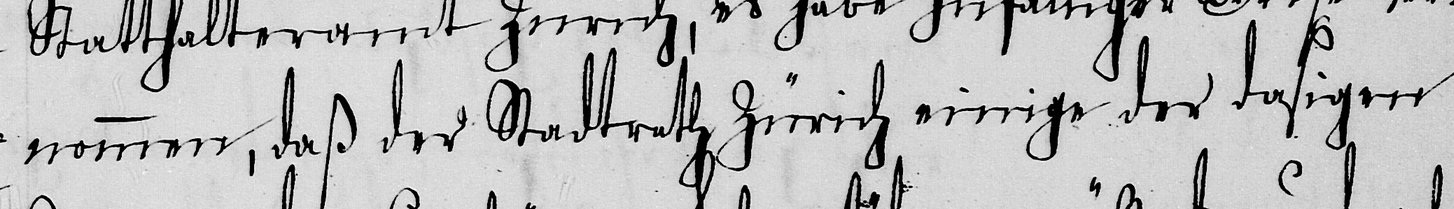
nommen, daß der Stadtrath Zürich einige der dasigen
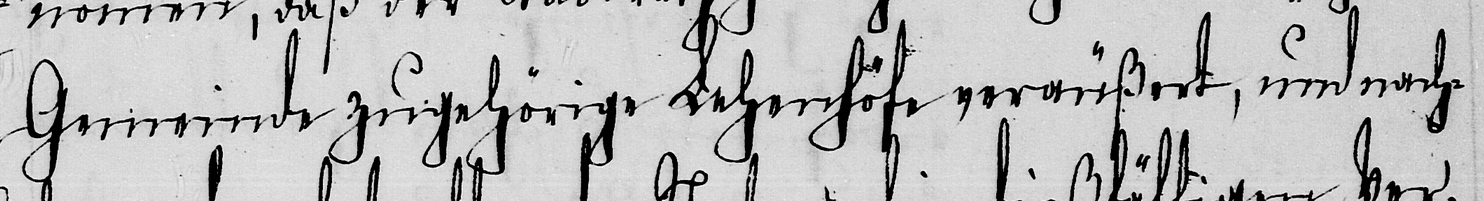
Gemeinde zugehörige Lehenhöfe veräußert, und nach¬
